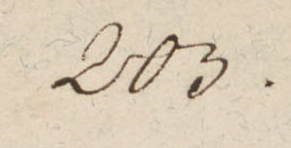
203.
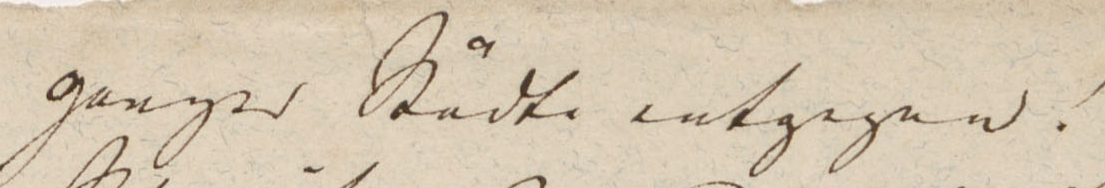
ganzer Städte entgegen!
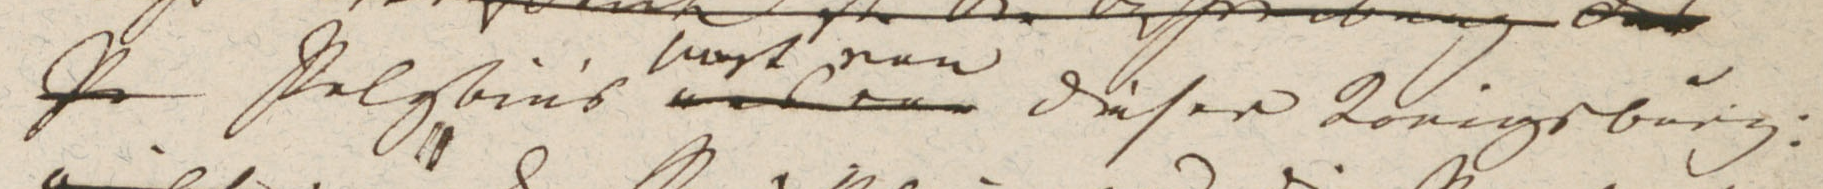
Po Polybius uns von sagt von dieser Konigsburg:
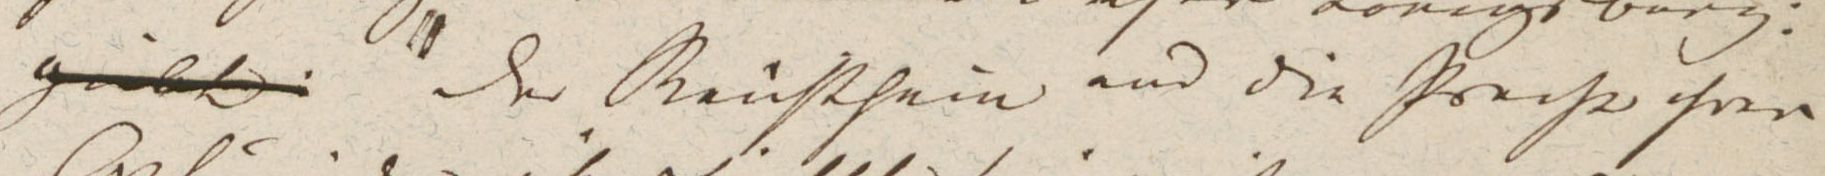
giebt: "Der Reichthum und die Pracht ihrer
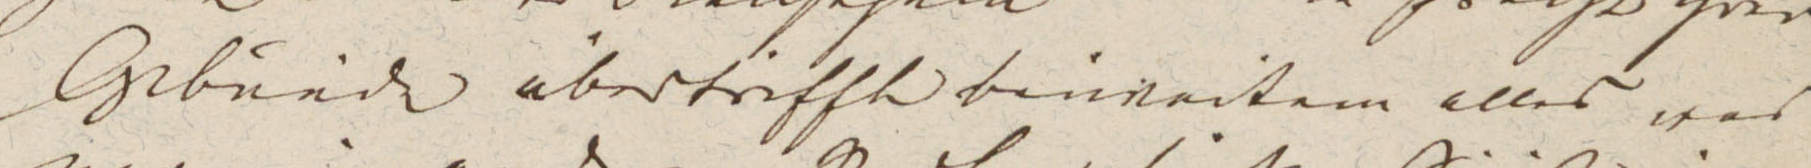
Gebäude übertrifft beiweitem alles was
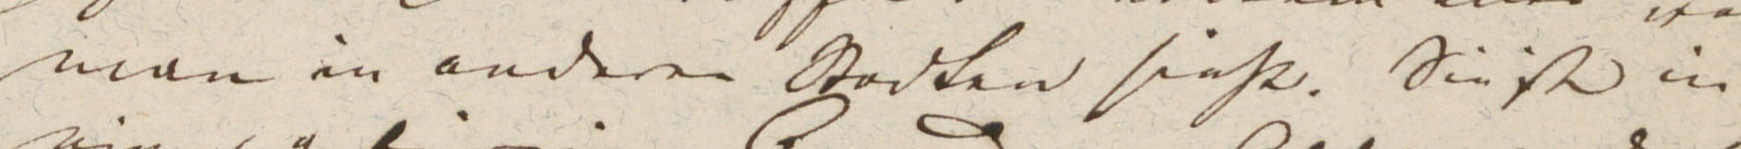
"man in anderen Stadten sieht. Sie ist in
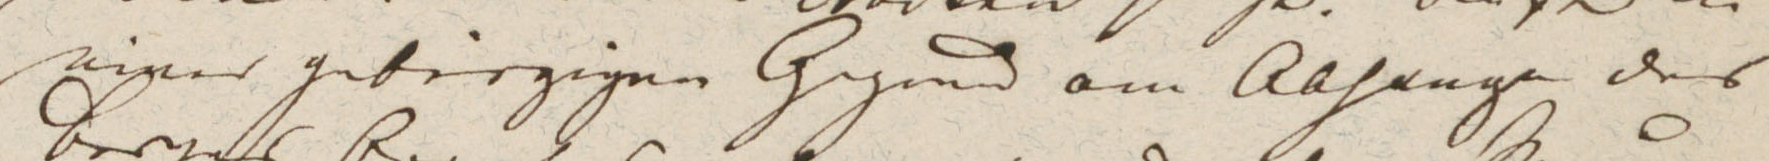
"einer gebirgigen Gegend am Abhange des
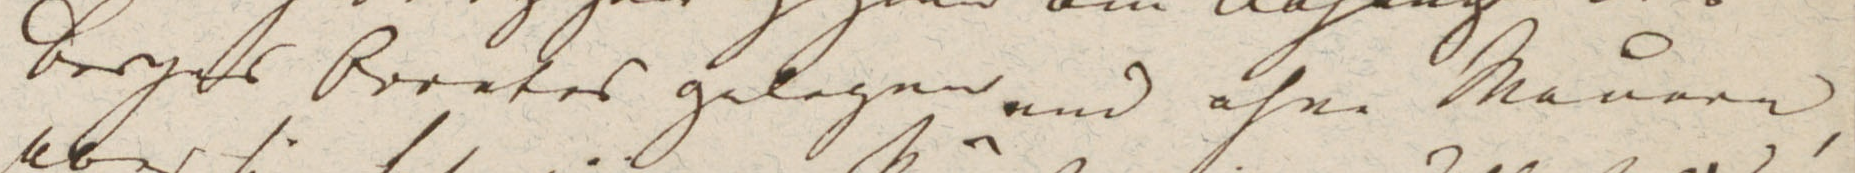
"Berges Orontes gelegen und ohne Mauern,
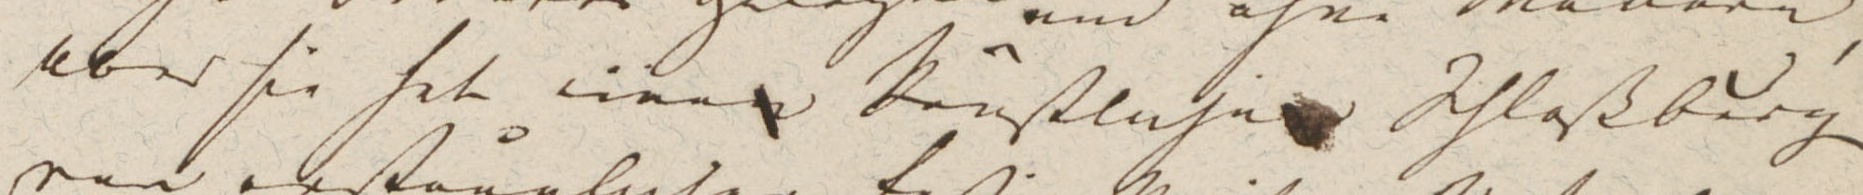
"aber sie hat einen künstlichen Schlossburg
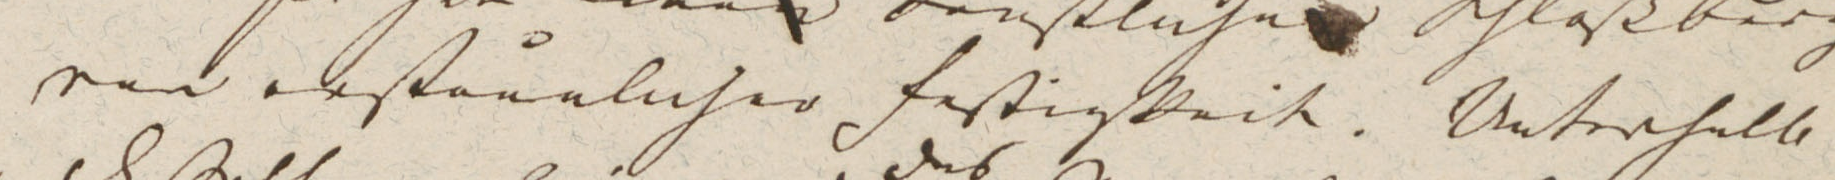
"von erstaunlicher Festigkeit. Unterhalb
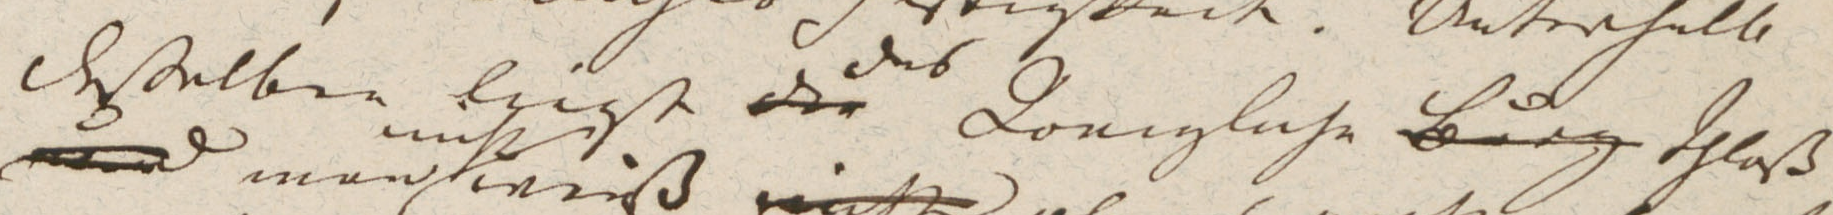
desselben liegt die das Konigliche Burg Schloss.
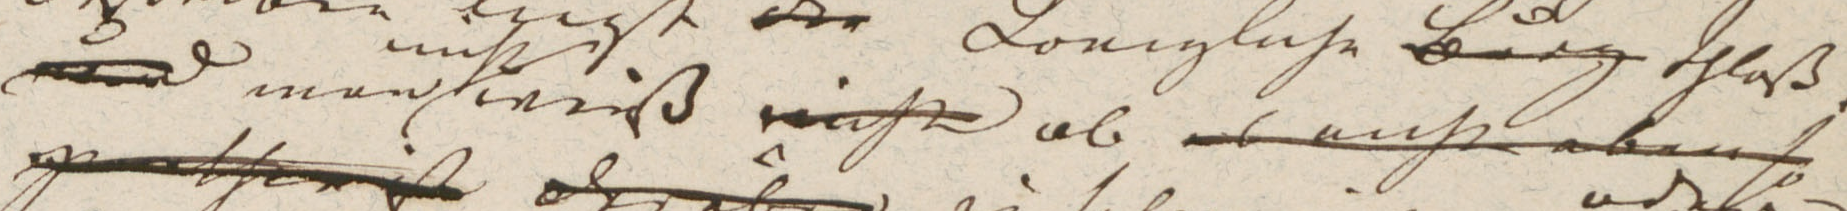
und man nicht weiss nicht ob es nicht eben so
